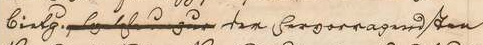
bietg. welche u. zur der hervorragendsten
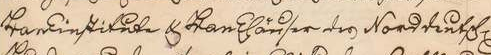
Bankinstitute & Bankhäuser des Norddeutschen
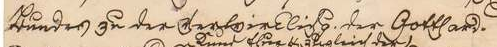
Bundes zu der Verwirklichg. der Gotthard -
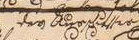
unsersKund thun &
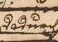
zugleich
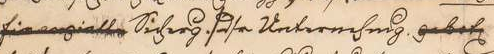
Sicherg. des zu d. Ausführg. dsr dsr Unternehmg. geboten
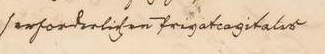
erforderlichen Privatcapitales
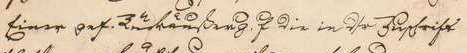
Einer gef. Rückäußerung auf die in dsr Zuschrift
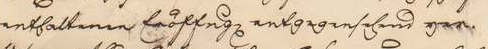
enthaltenen Eröffnungen entgegensehend ver-
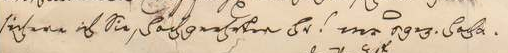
sichere ich Sie, hochgeehrter Hr! mr ausgez. Hocha.
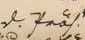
d. Präst
